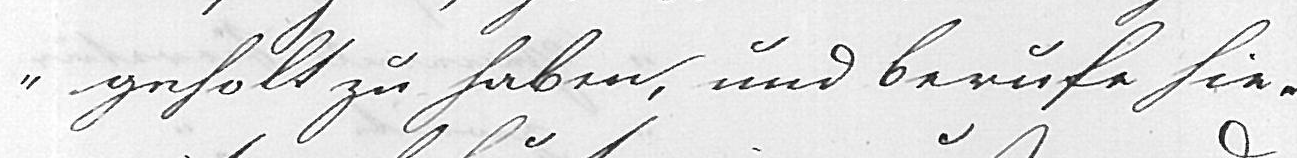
" geholt zu haben, und berufen hie-
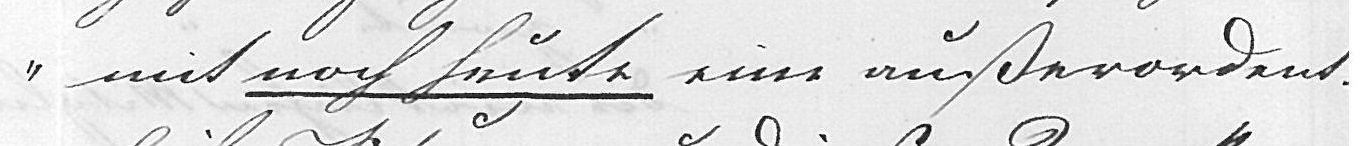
" mit noch heute eine außerordent-
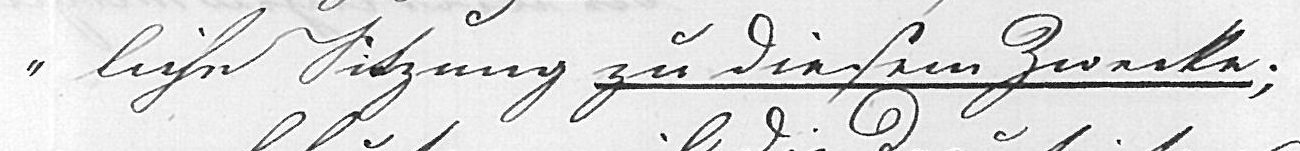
" liche Sitzung zu diesem Zwecke;
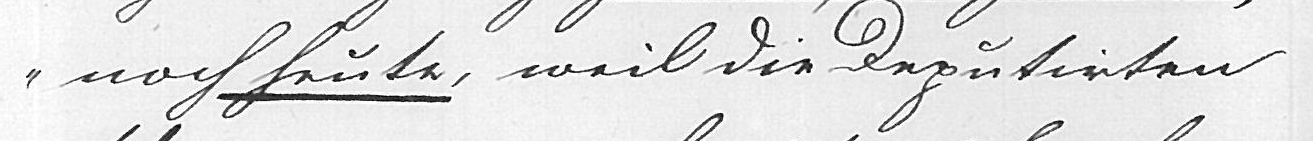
" noch heute, weil die Deputierten
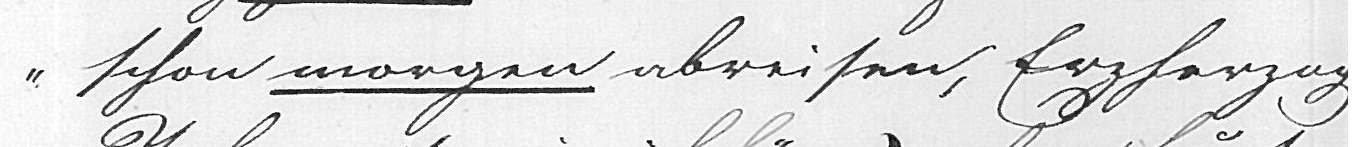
" schon morgen abreisen, Erzherzog
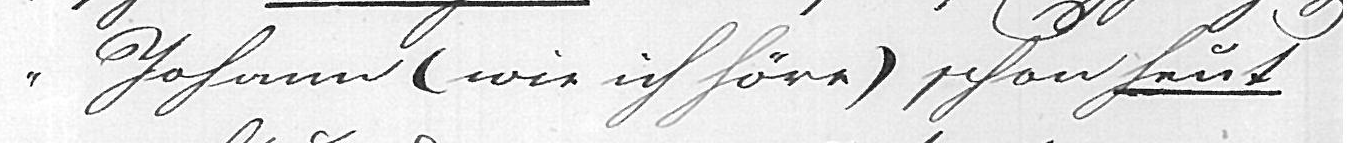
" Johann (wie ich höre) schon heut
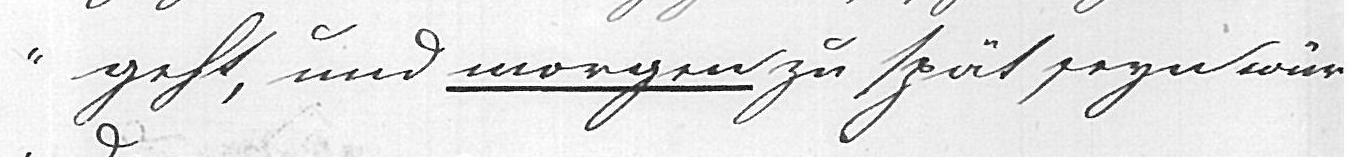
" geht, und morgen zu spät seyn wür-
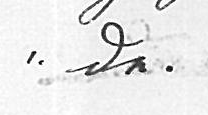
" de.
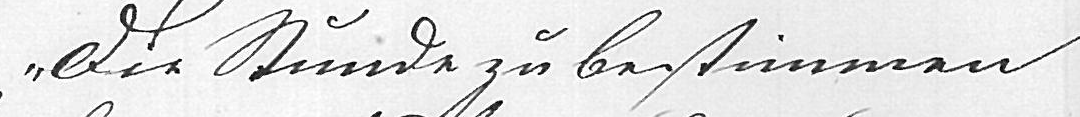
" Die Stunde zu bestimmen
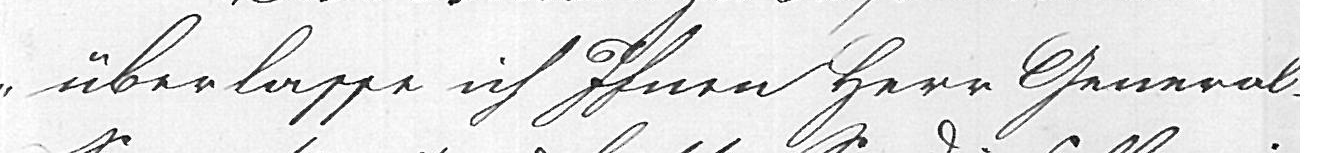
" überlasse ich Ihnen Herr General-
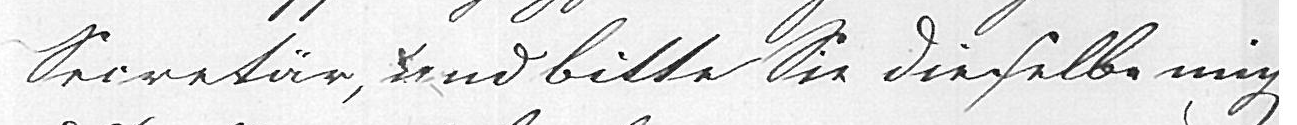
" Secretär, und bitte Sie dieselbe mich
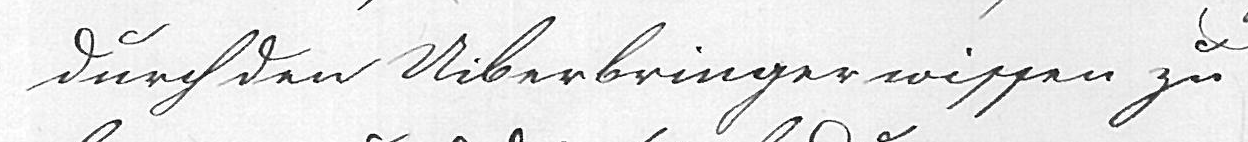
" durch den Uiberbringer wissen zu
